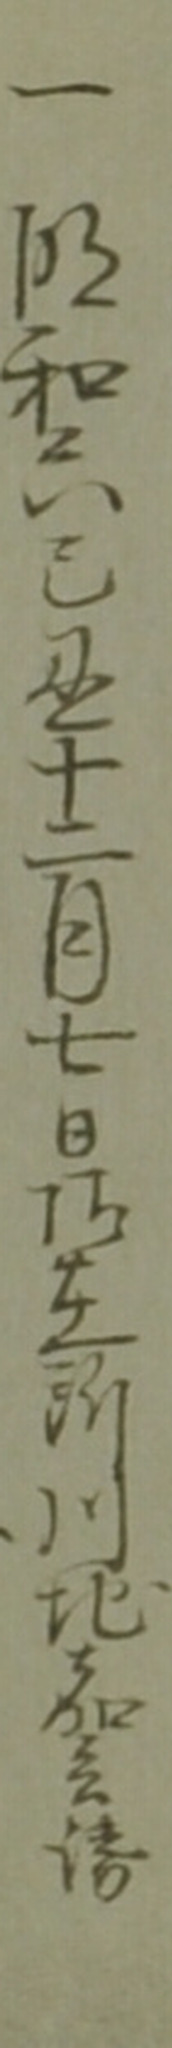一明和六己丑十二月七日御在所川地嘉兵衛
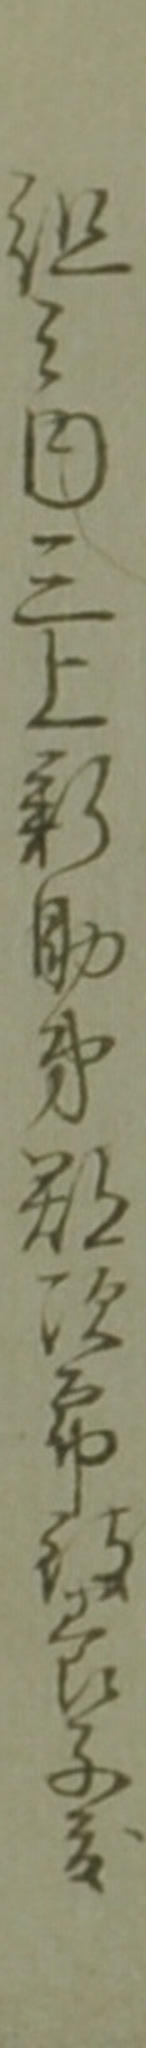組之内三上新助弟郡次郎致養子度
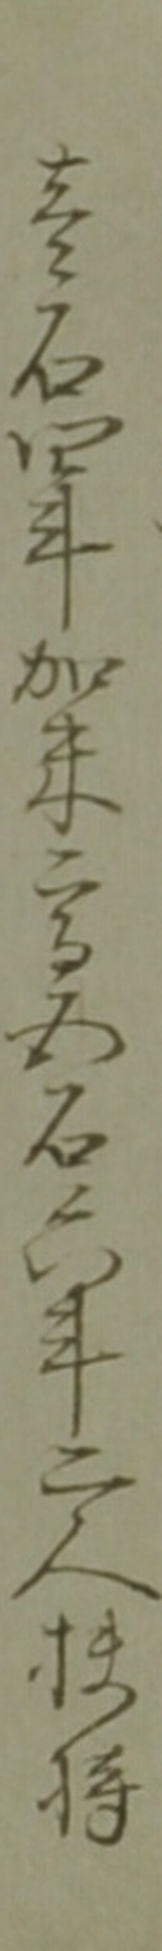壱石四斗加米高五石六斗二人扶持

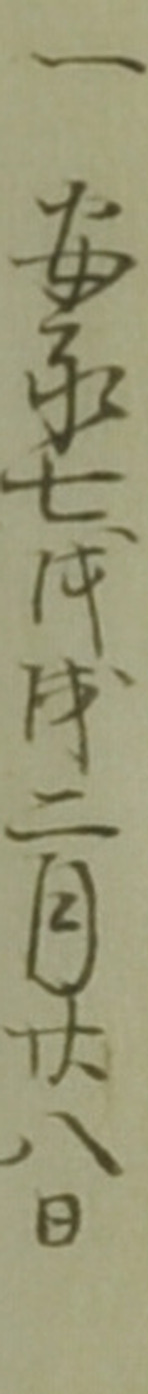一安永七戊戌二月廿八日

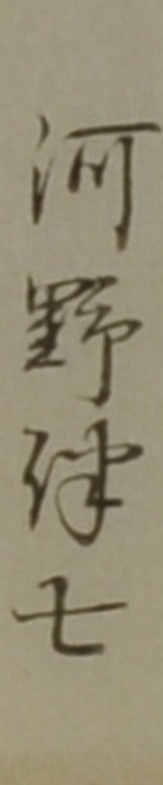河野伴七
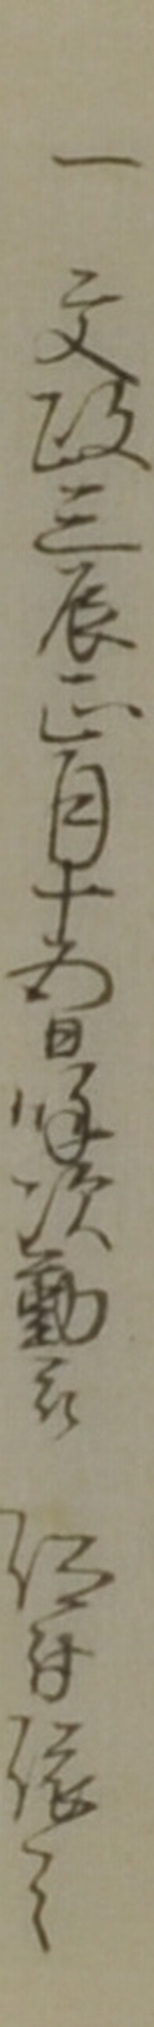一文政三辰正月十五日呼次勤被仰付依之
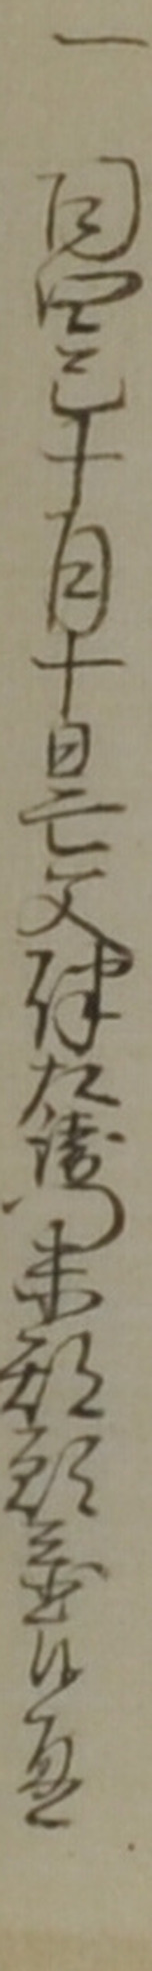一同四巳十月十日亡父伴左衛門末期願置候通
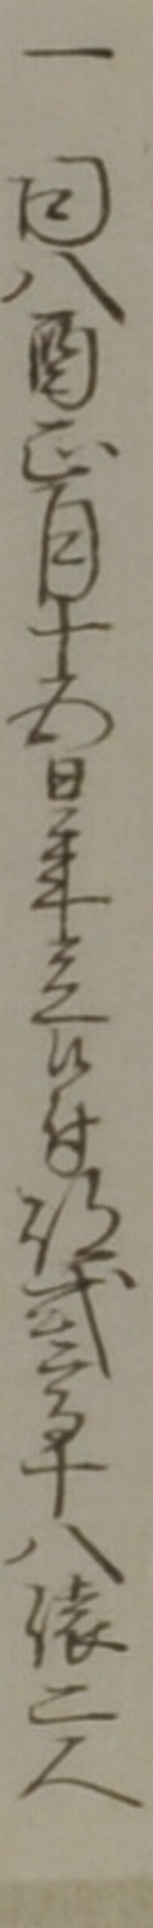一同八酉正月十五日年立候付跡式高十八俵二人
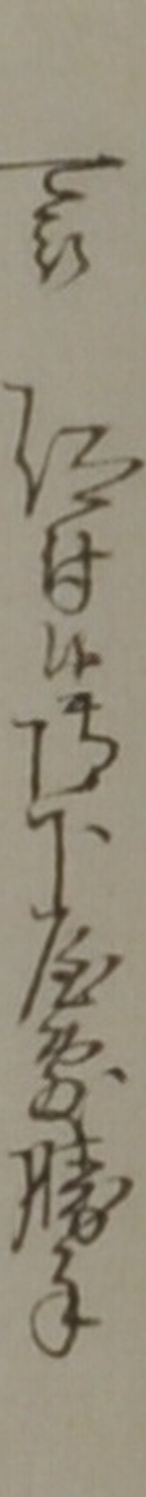可候仰付候御下屋敷勝手
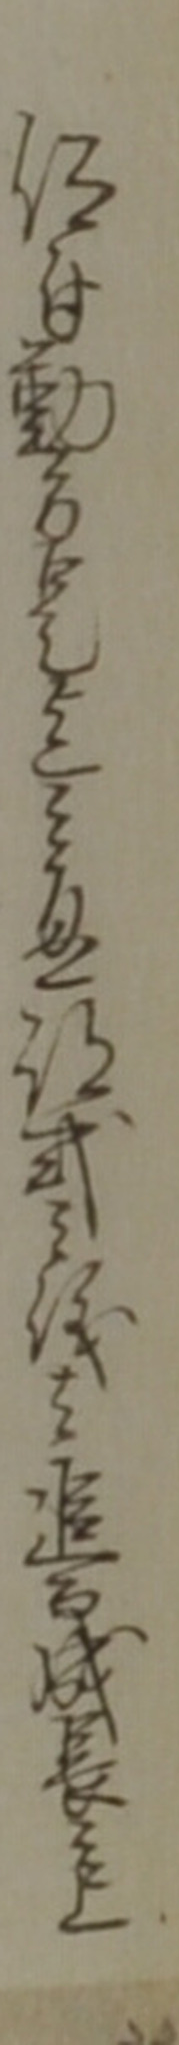仰付勤方是迄之通跡式之儀者追而成長之上
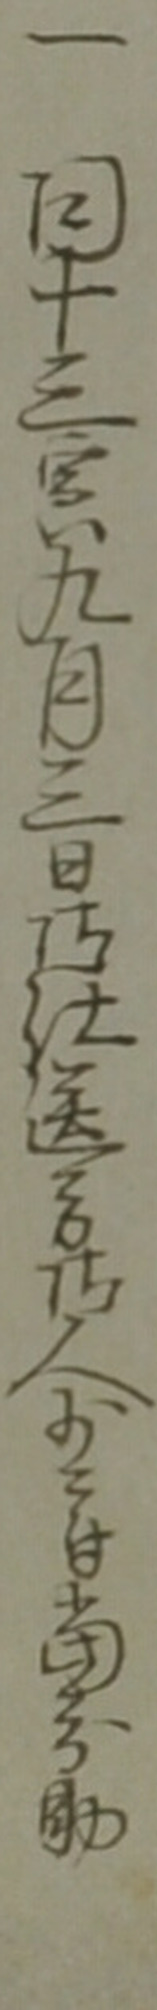一同十三寅九月三日御仕送方御人少ニ付当分助
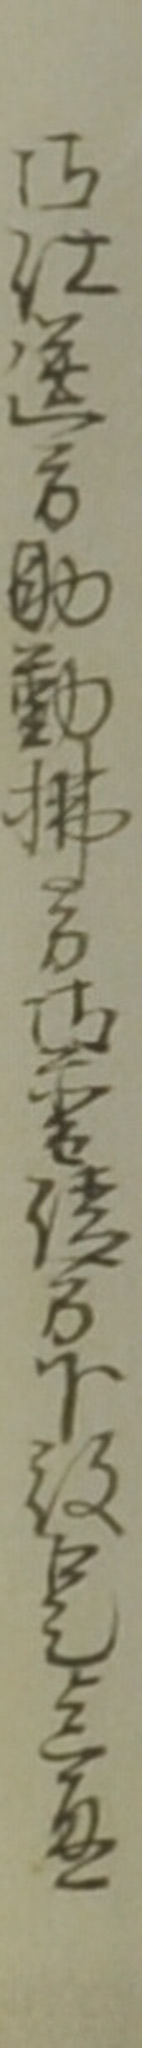御仕送方助勤払方御普請方下役是迄通
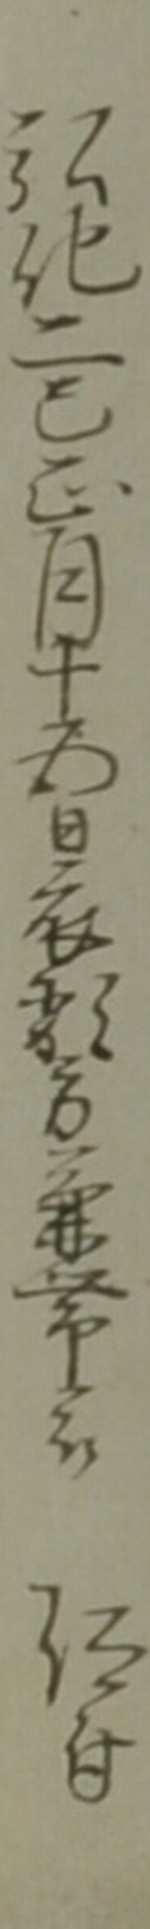一弘化二巳正月十五日衣類方兼帯被仰付

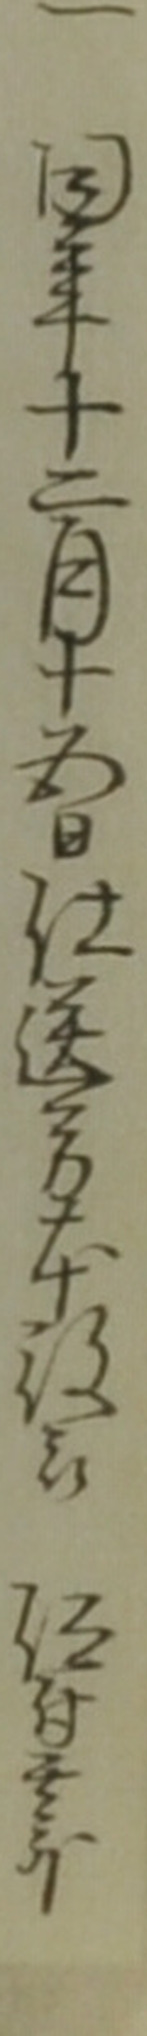一同年十二月十五日仕送方本役被仰付其外
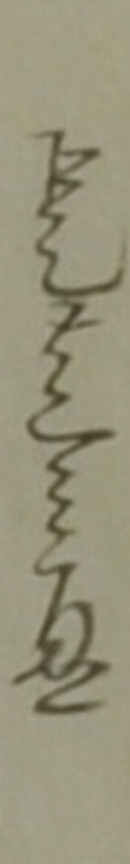是迄之通
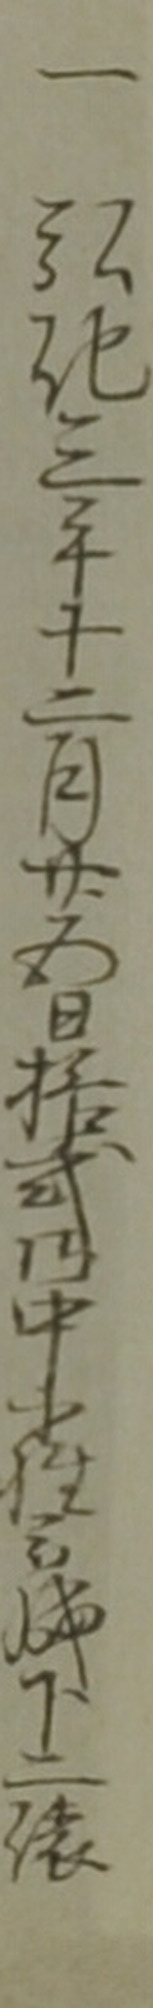一弘化三午十二月廿五日格式御中小性被成下二俵
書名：無足諸士勤仕録（三）
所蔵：伊那市立高遠町図書館・合同会社AMANE
